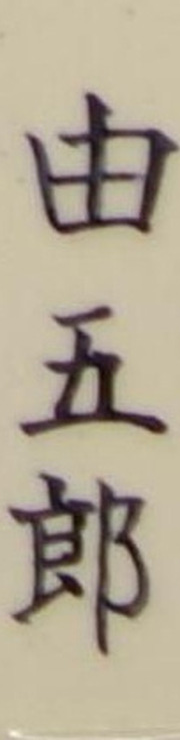由五郎
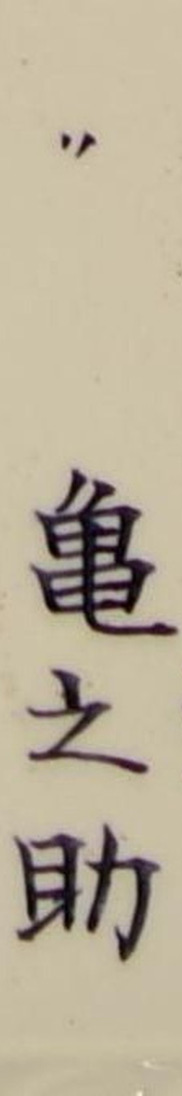亀之助
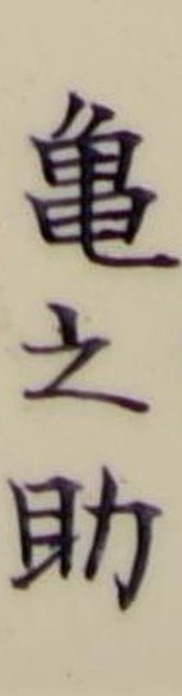亀之助
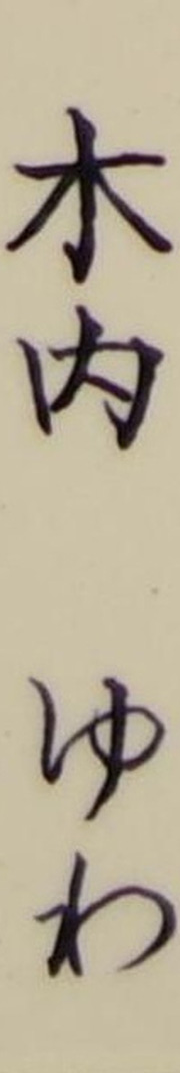木内ゆわ
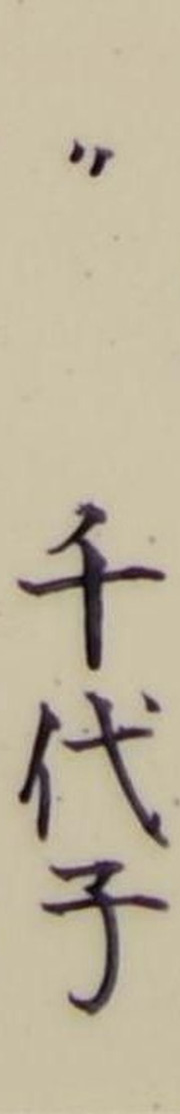千代子
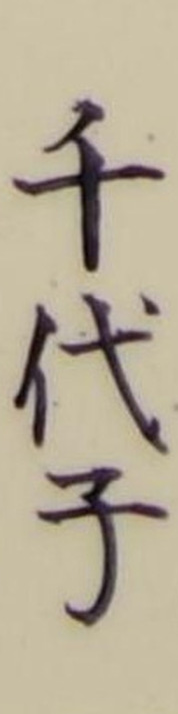千代子

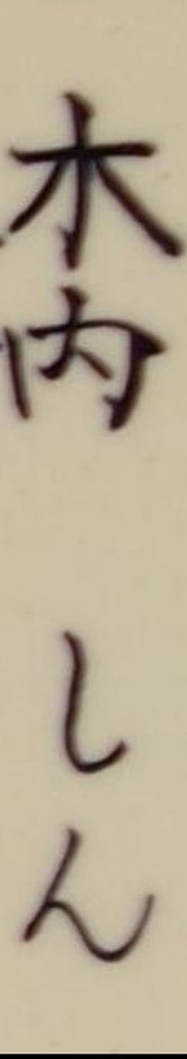木内しん
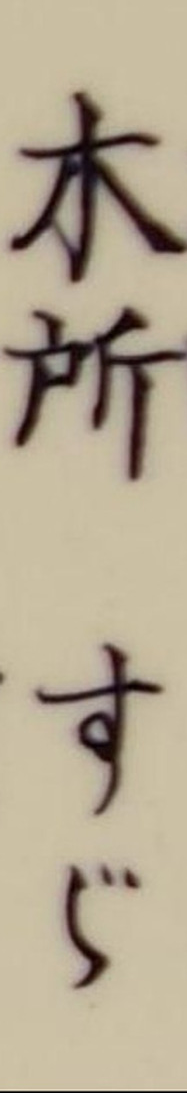木所すゞ
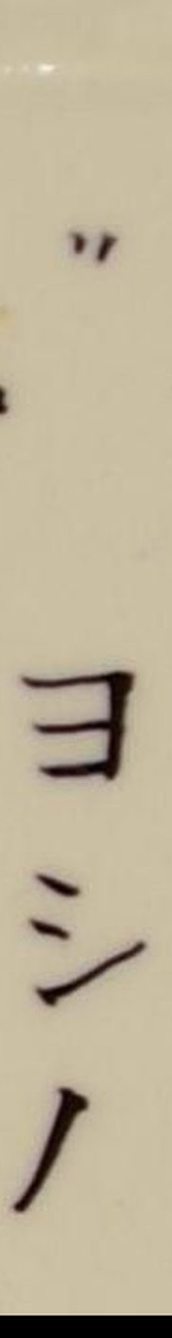ヨシノ
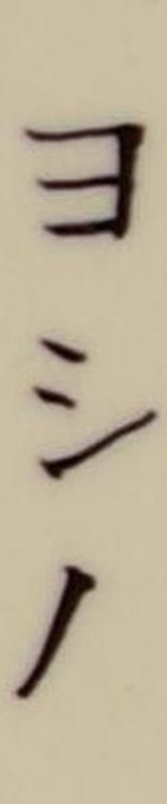ヨシノ
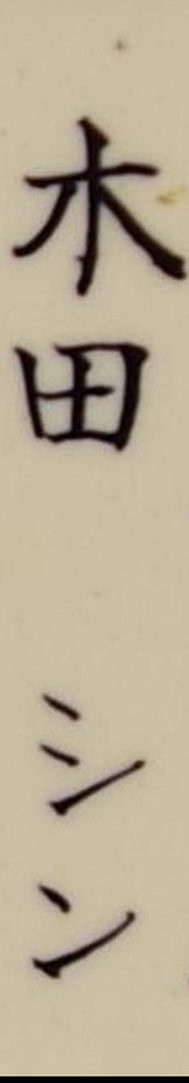木田シン
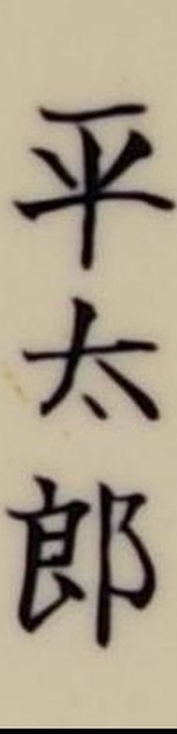平太郎
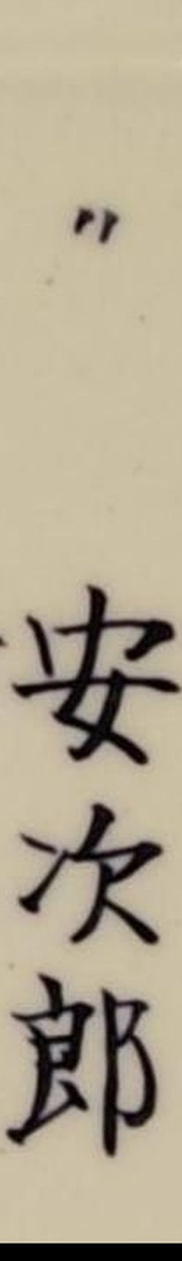安次郎
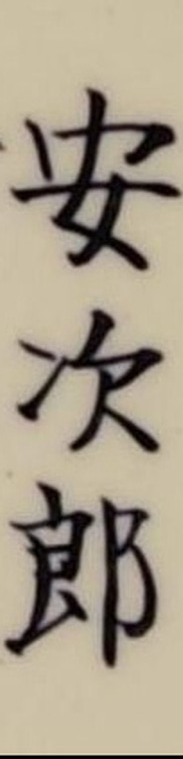安次郎
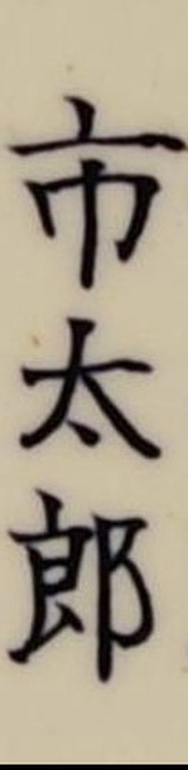市太郎
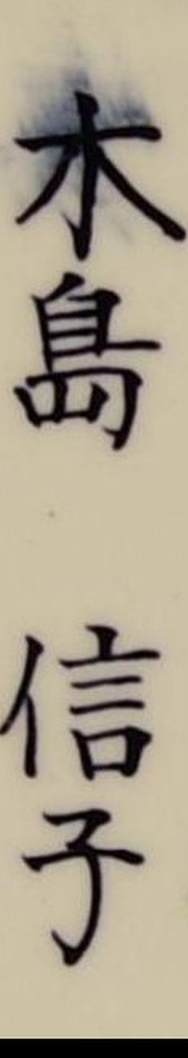木島信子
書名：E~L
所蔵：高野山金剛峯寺
